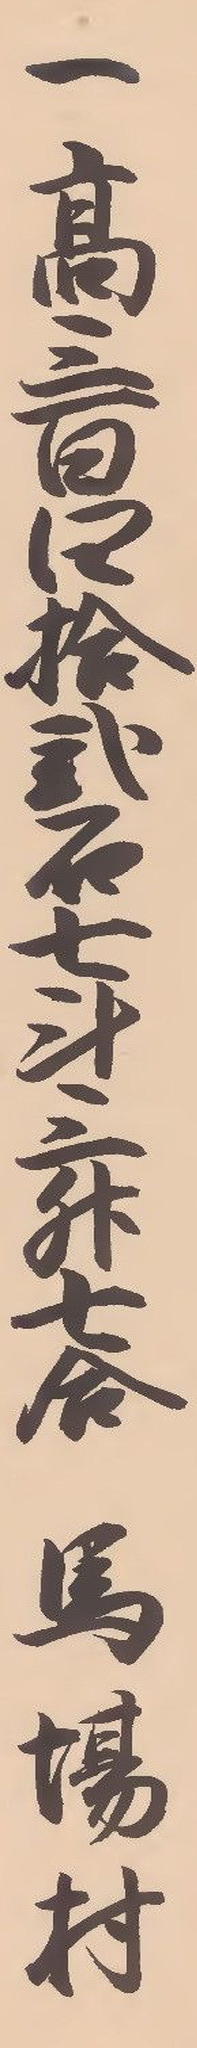一高三百四拾弐石七斗三升七合馬場村
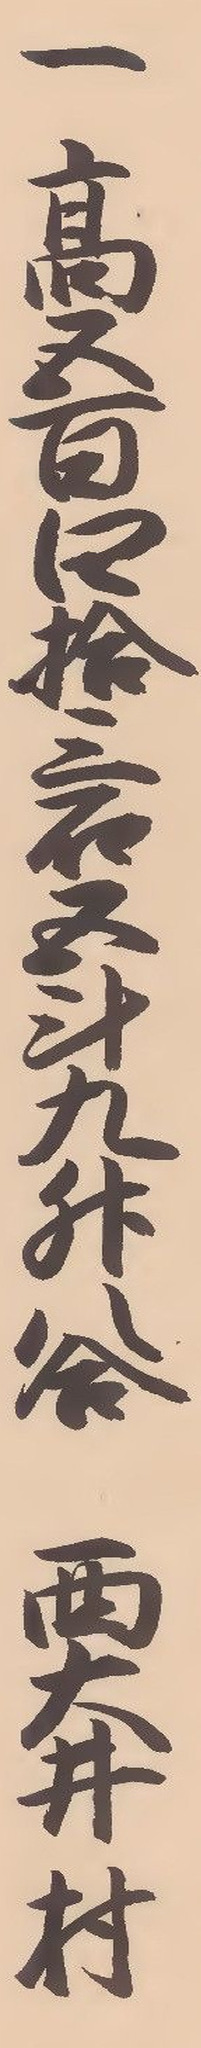一高五百四拾三石五斗九升八合西大井村
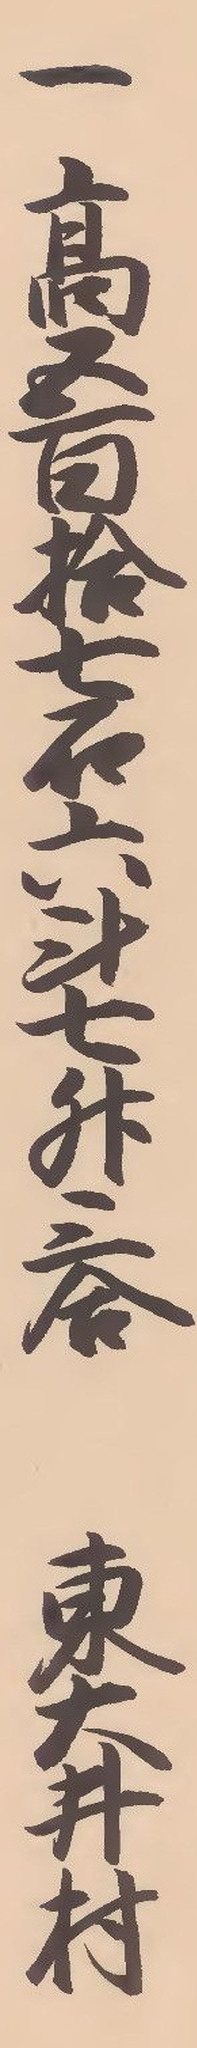一高五百拾七石六斗七升三合東大井村
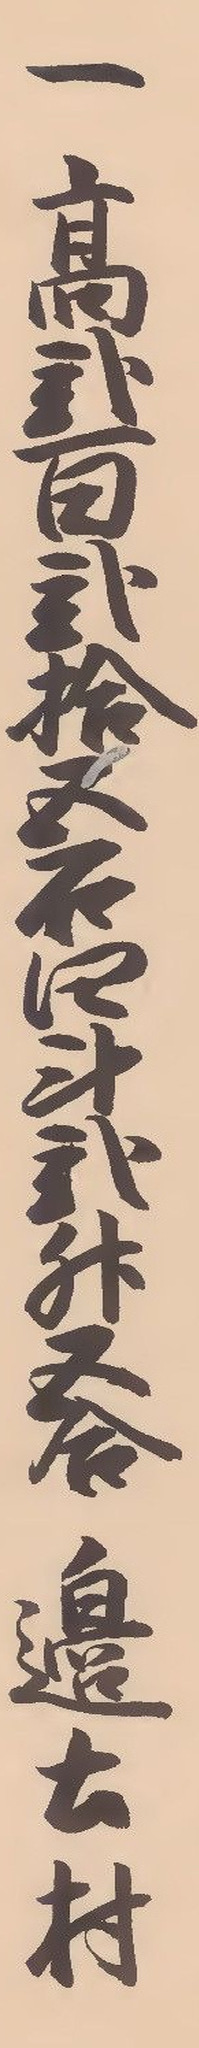一高弐百弐拾五石四斗弐升五合辺土村

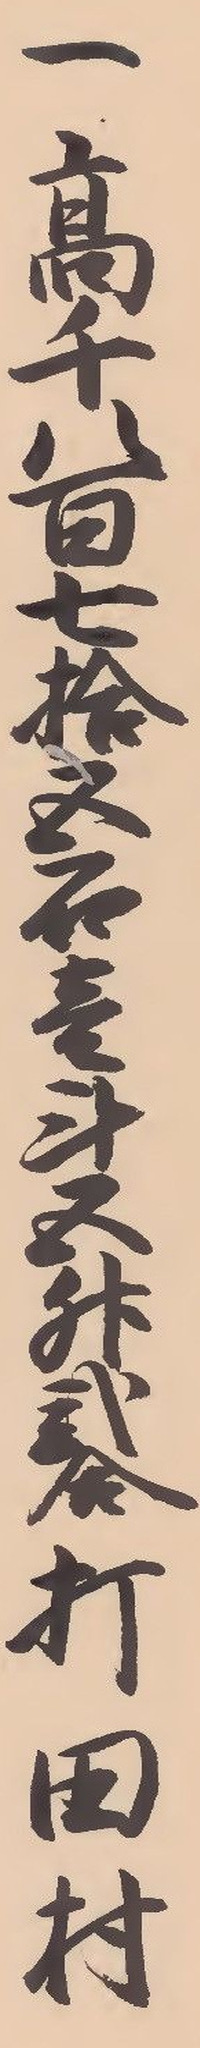一高千八百七拾五石壱斗五升弐合打田村
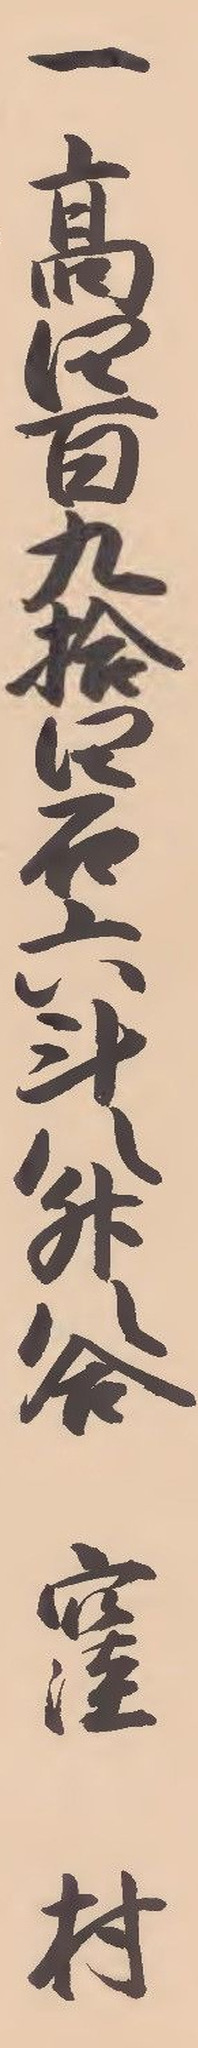一高四百九拾四石六斗八升八合窪村
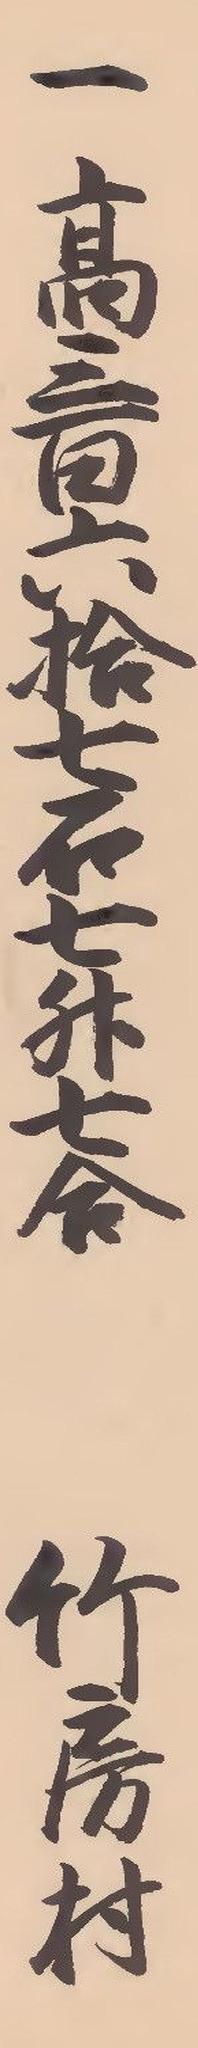一高三百六拾七石七升七合竹房村
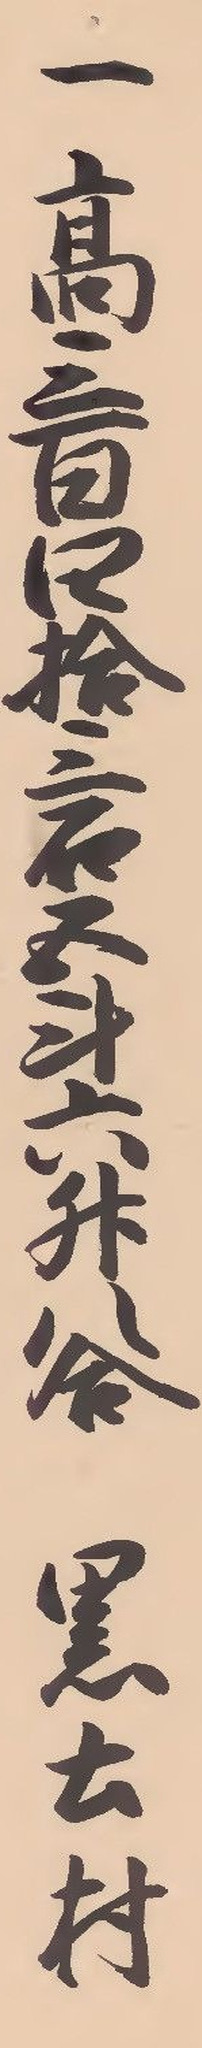一高三百四拾三石五斗六升八合黒土村
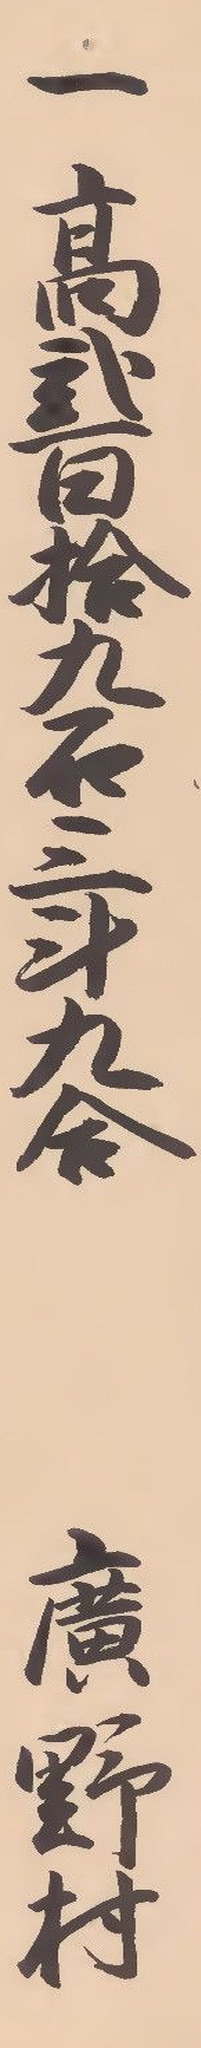一高弐百拾九石三斗九合広野村
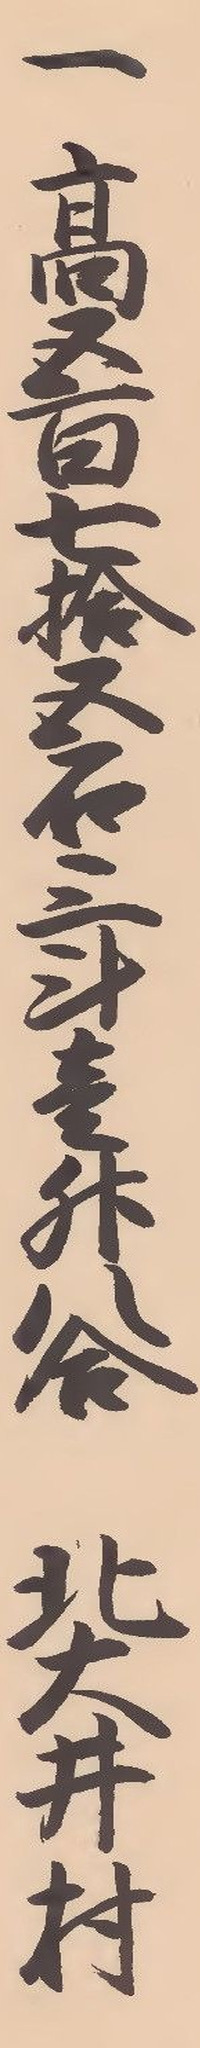一高五百七拾五石三斗壱升八合北大井村
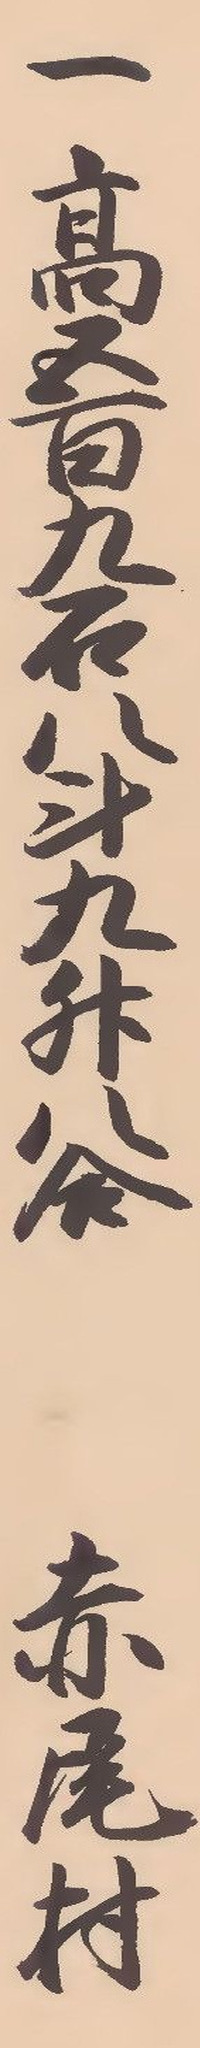一高五百九石八斗九升八合赤尾村
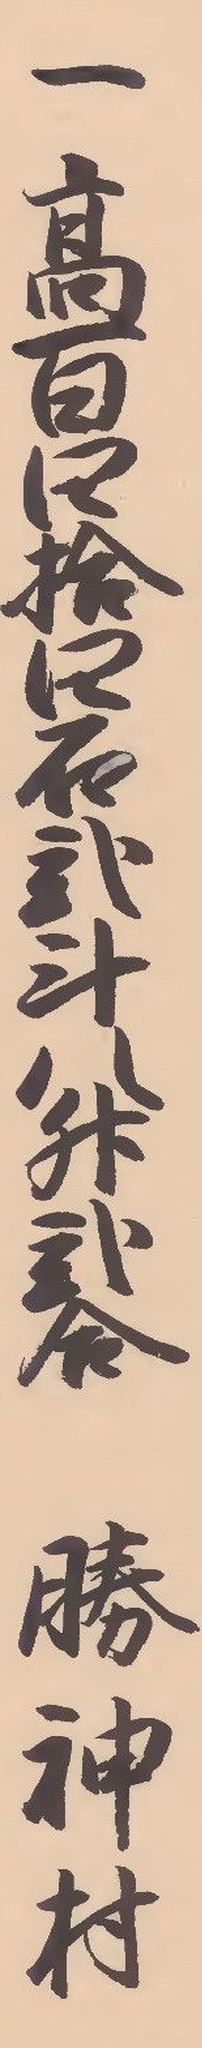一高百四拾四石弐斗八升弐合勝神村

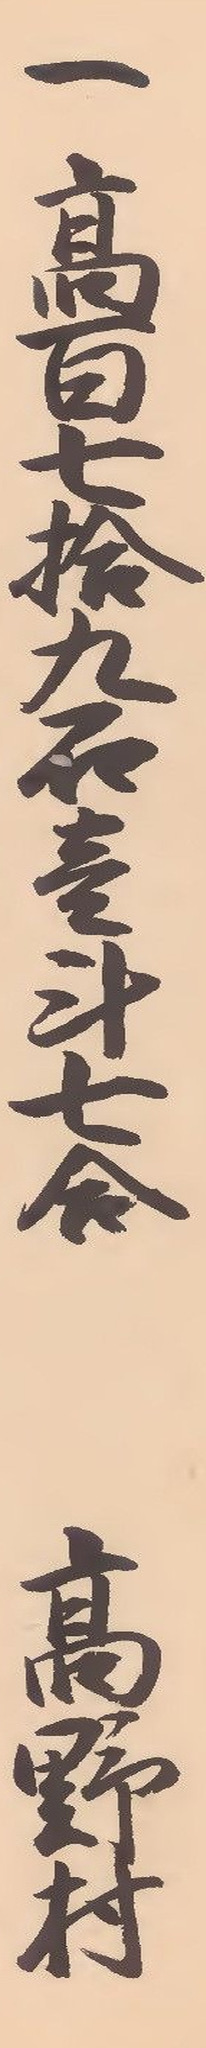一高百七拾九石壱斗七合高野村
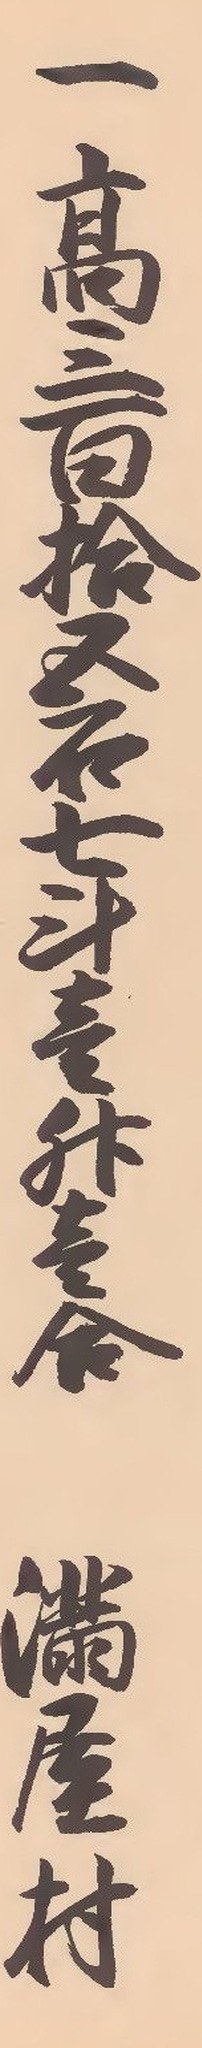一高三百拾五石七斗壱升壱合満屋村
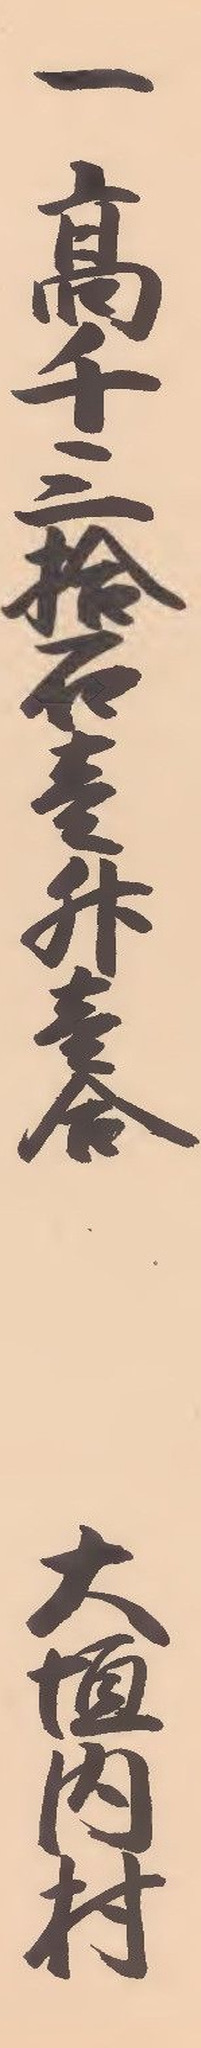一高千三拾石壱升壱合大垣内村
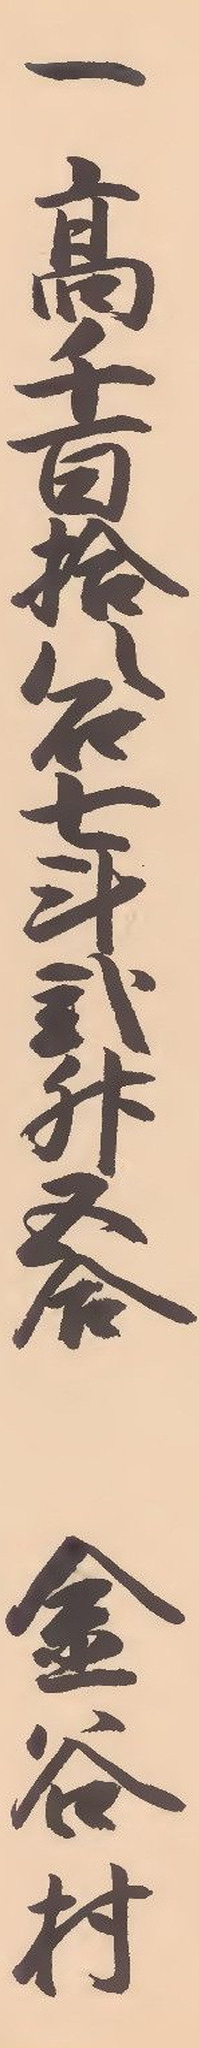一千百拾八石七斗弐升五合金谷村
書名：紀伊国郷帳
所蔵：国立公文書館 National Archives of Japan
